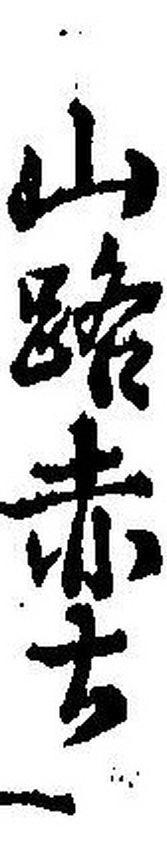山路赤土
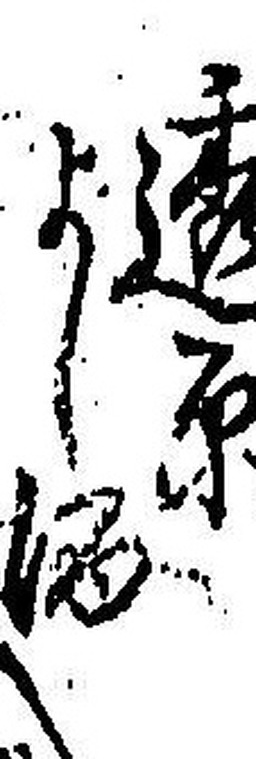よし酒
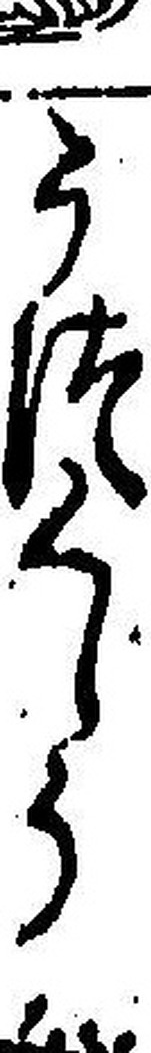うつくしう
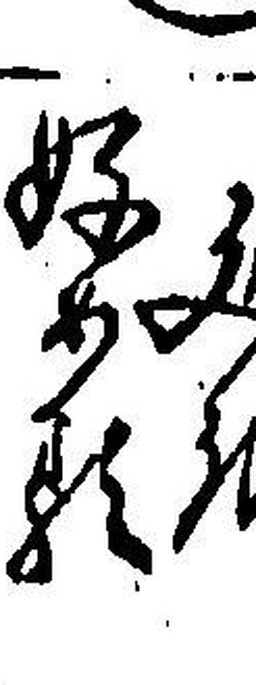好める
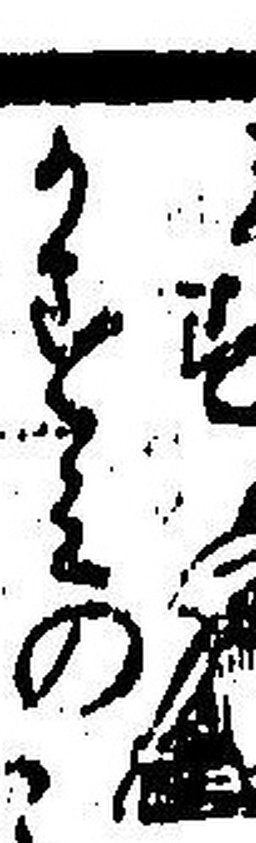かすみの
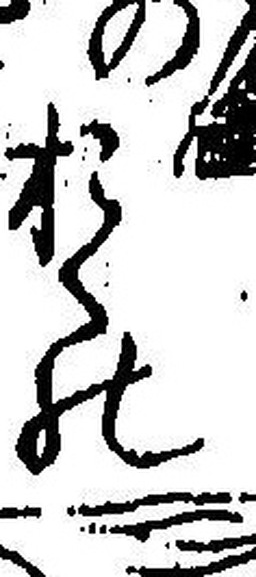おくの
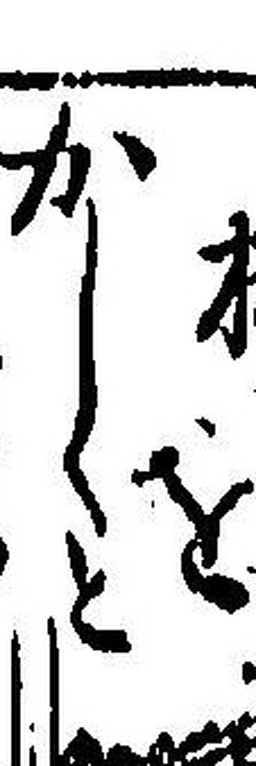かしくと
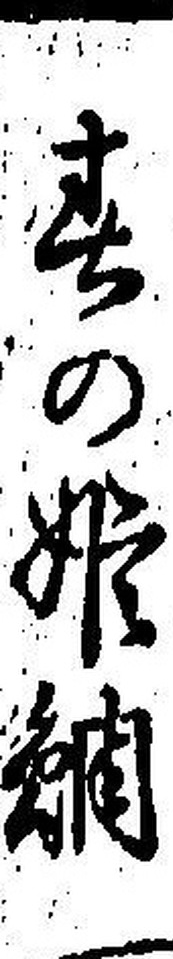春の姫鯛
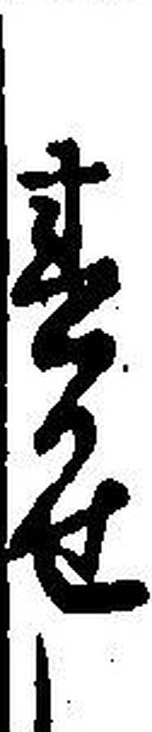春かせ
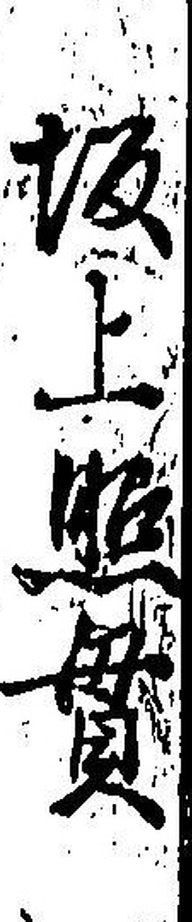坂上照貫
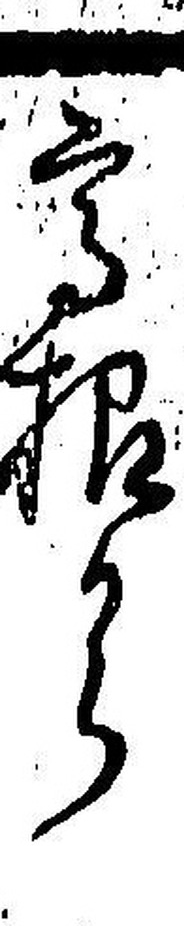高根から
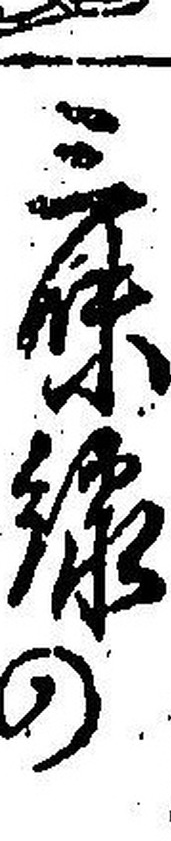三味線の
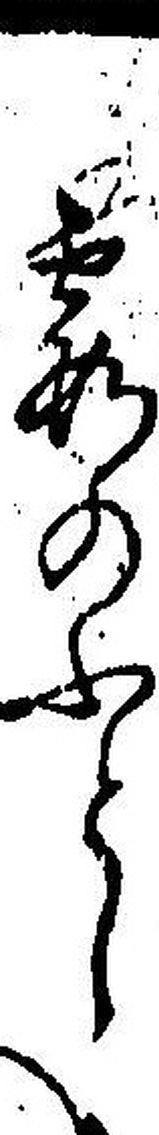霞のふとし
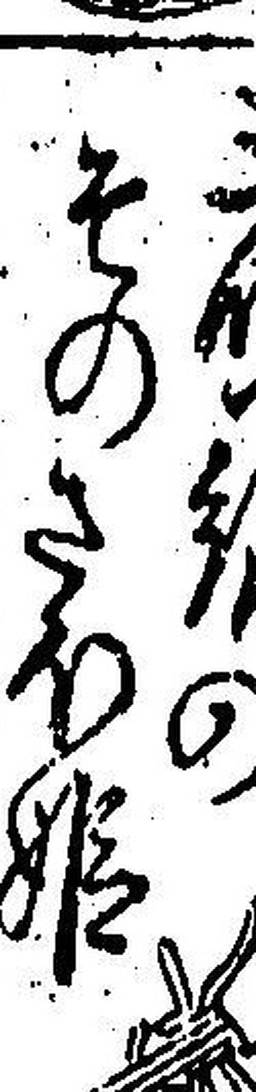そのさほ姫
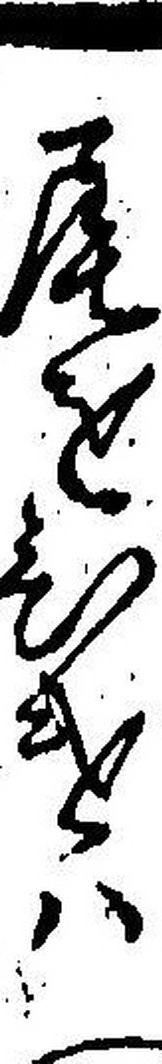尾をひけは
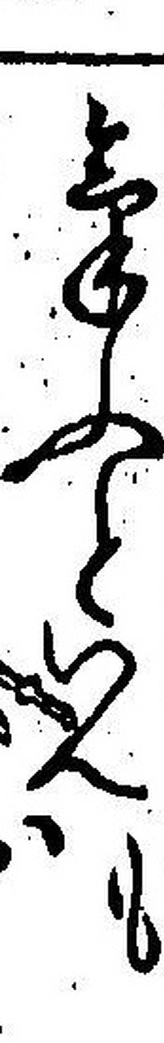けふといへは
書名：どうれ百人一首 / 鹿都部真顔(狂歌堂)編
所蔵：東京大学総合図書館 General Library in the University of Tokyo, JAPAN
